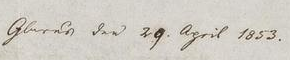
Glarus, 29. April 1853.
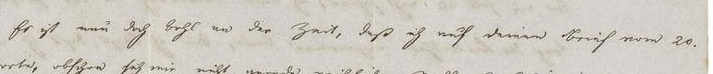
Es ist nun doch wohl an der Zeit, daß Ich auf deinen Brief vom 20.
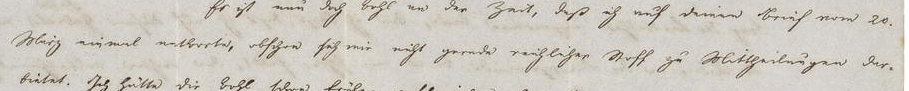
März einmal antworte, obschon sich mir nicht gerade reichlicher Stoff zu Mittheilungen dar-
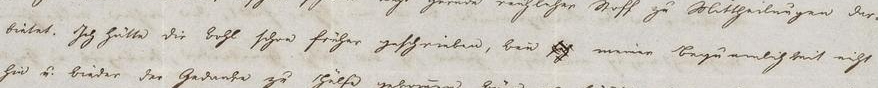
bietet. Ich hätte dir wohl schon früher geschrieben, wenn sich meiner Bequemlichkeit nicht
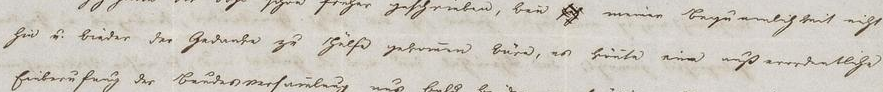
hin u. wieder der Gedanke zu Hülfe gekommen wäre, es könnte eine außerordentliche
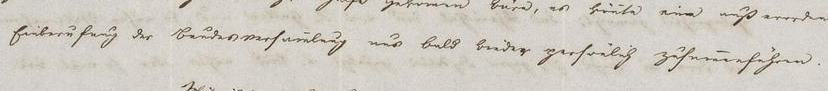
Einberufung der Bundesversammlung uns bald wieder persönlich zusammenführen.
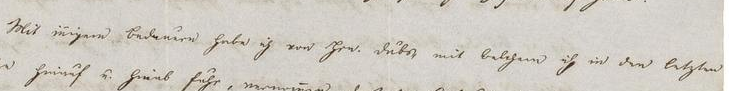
Mit innigem Bedauern habe ich von Hrn. Dubs, mit welchem ich in den letzten
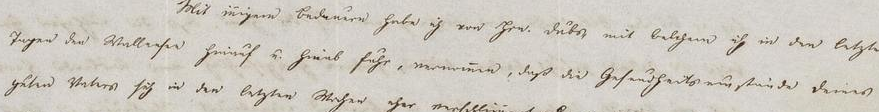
Tagen den Wallensee hinauf u. hinab fuhr, vernommen, daß die Gesundheitsumstände Deines
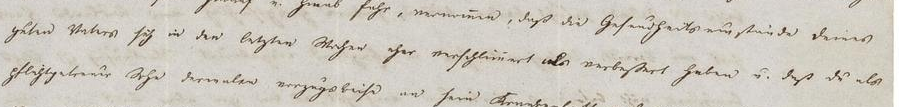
guten Vaters sich in den letzten Wochen eher verschlimmert als verbeßert haben u. daß Du als
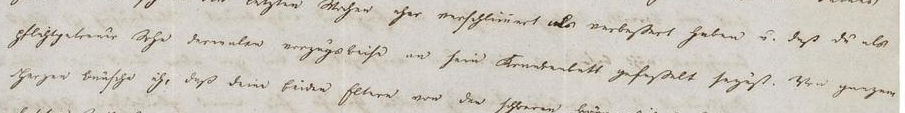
pflichgetreuer Sohn dermalen vorzugsweise an sein Krankenbett gefeßelt seyest. Von ganzem
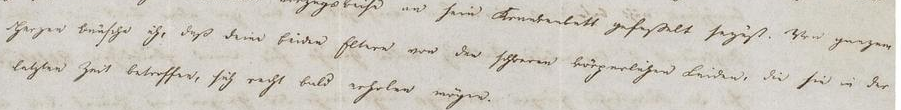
Herzen wünsche ich, daß Deine beiden Eltern von den schweren körperlichen Leiden, die sie in der
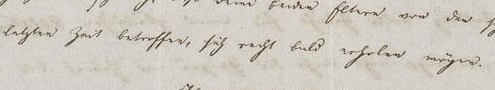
letzten Zeit betroffen, sich recht bald erholen mögen.
